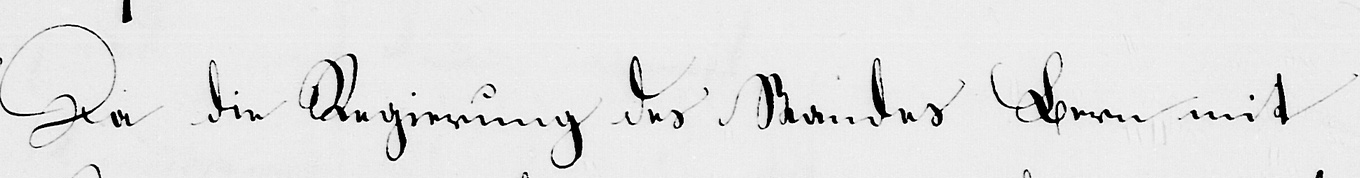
Da die Regierung des Standes Bern mit
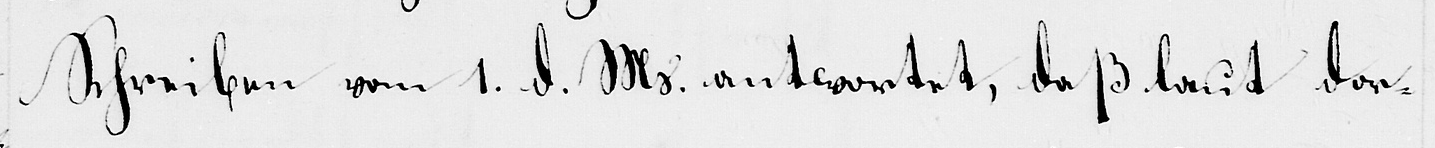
Schreiben vom 1. d. Ms. antwortet, daß laut dor¬
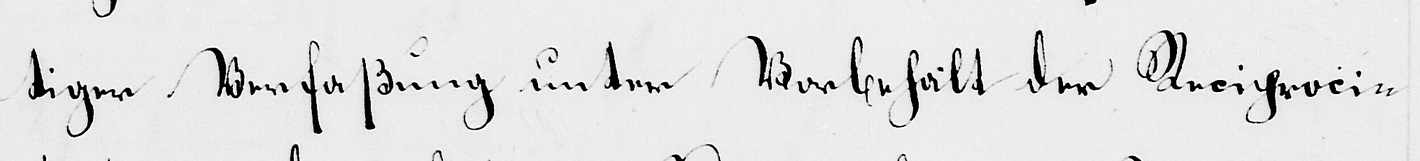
tiger Verfaßung unter Vorbehalt der Reciproci¬
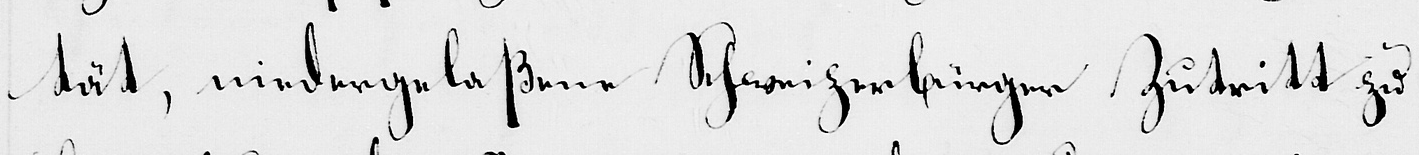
tät, niedergelaßene Schweizerbürger Zutritt zu
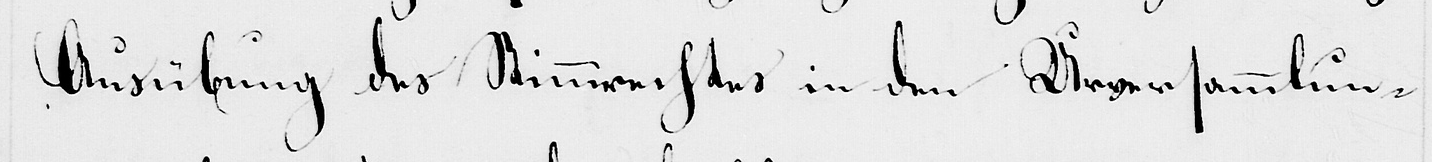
Ausübung des Stimmrechtes in den Urversammlun¬
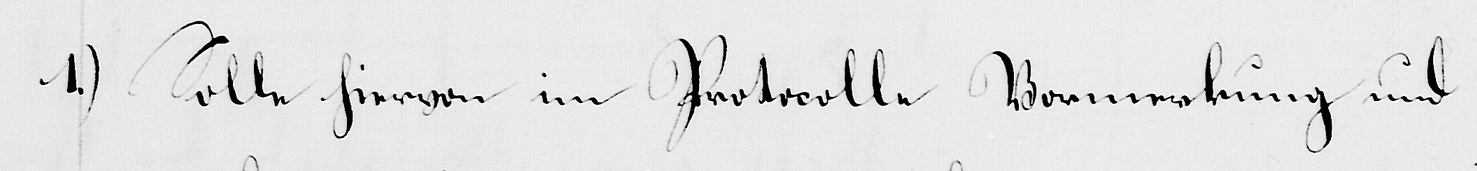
1.) Solle hiervon im Protocolle Vormerkung und
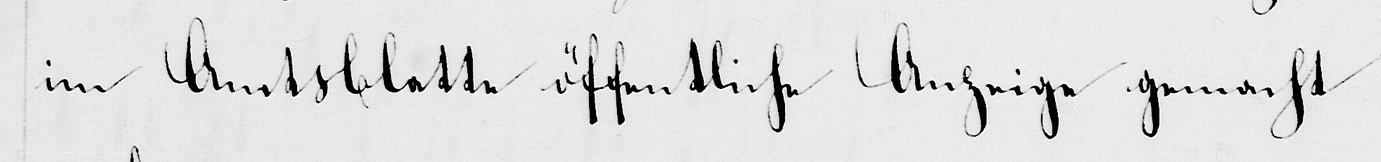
im Amtsblatte öffentliche Anzeige gemacht
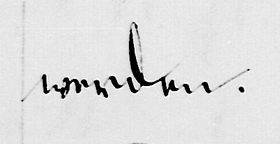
werden.
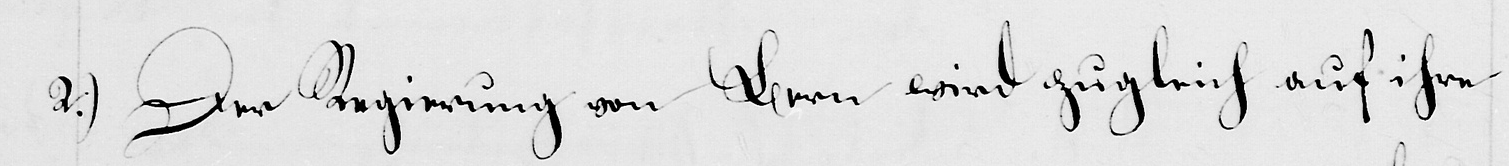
2.) Der Regierung von Bern wird zugleich auf ihre
